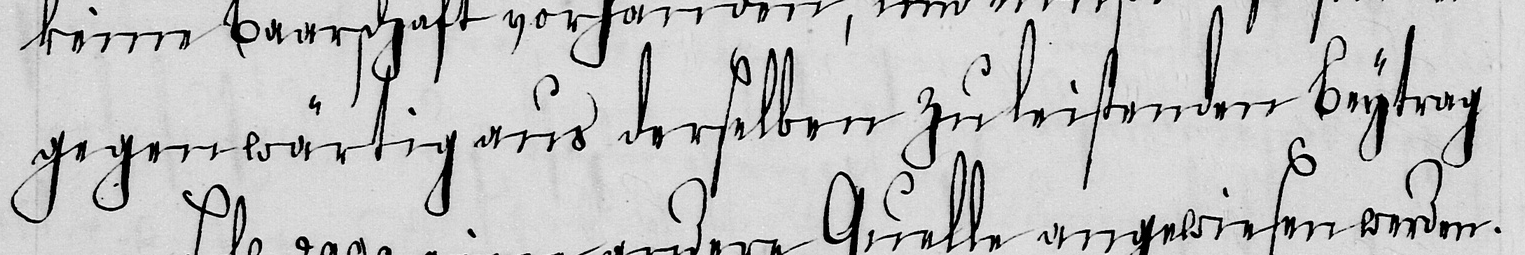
gegenwärtig aus derselben zu leistenden Beytrag
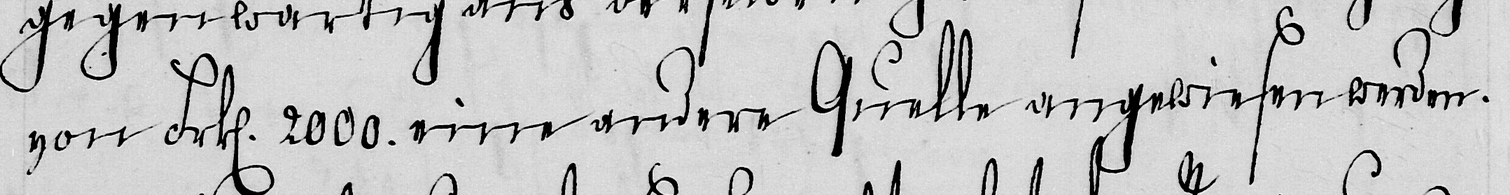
von Frk[en]. 2000. eine andere Quelle angewiesen werden.
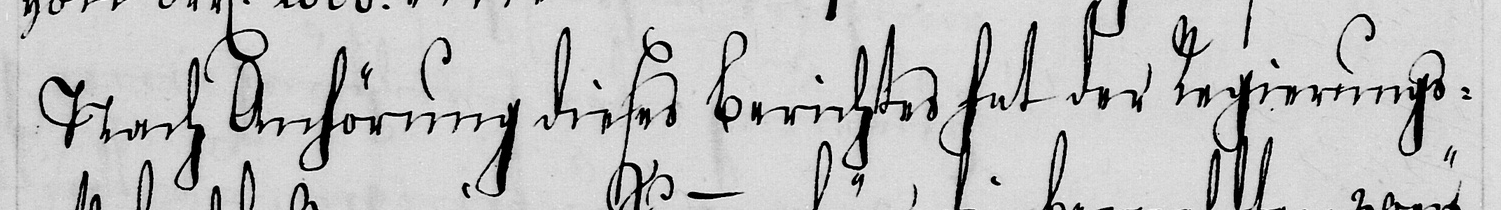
Nach Anhörung dieses Berichtes hat der Regierungs¬
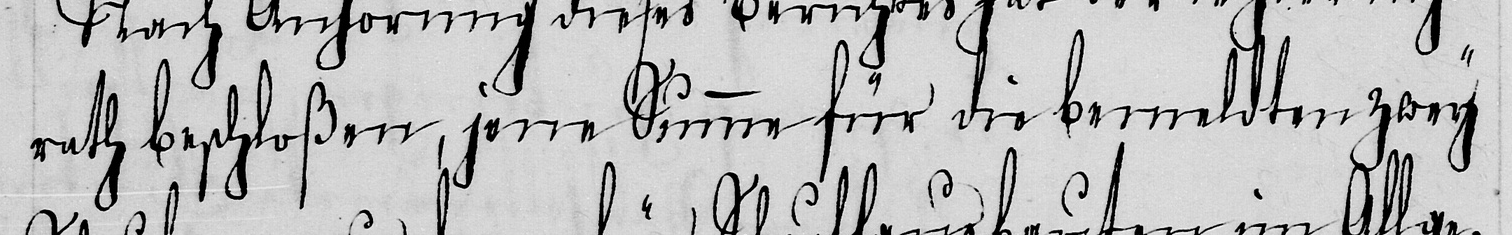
rath beschloßen, jene Summe für die bemeldten zwey
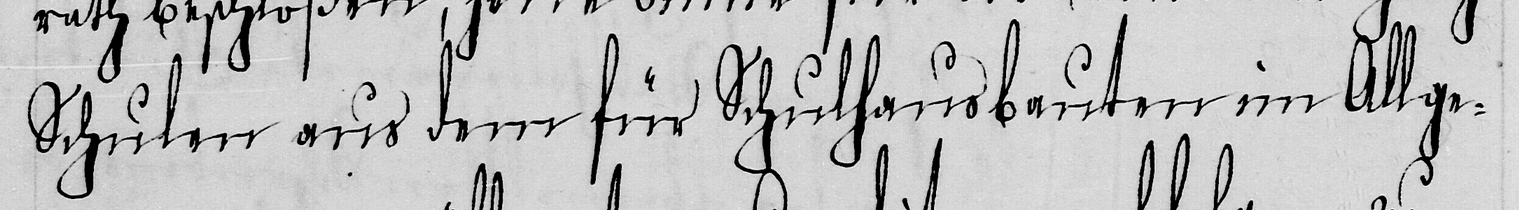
Schulen aus dem für Schulhausbauten im Allge¬
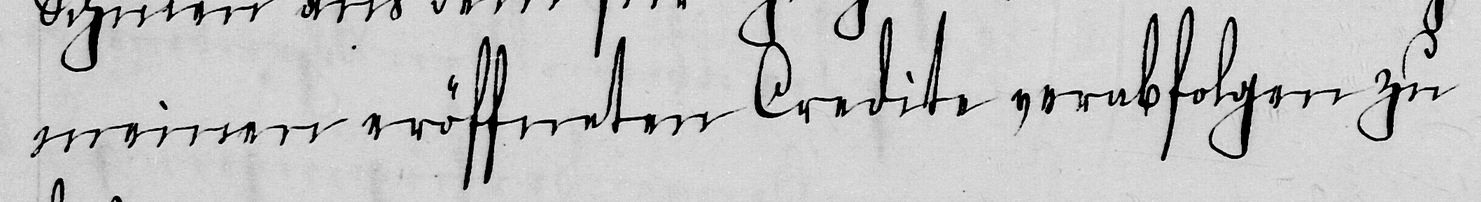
meinen eröffneten Credite verabfolgen zu
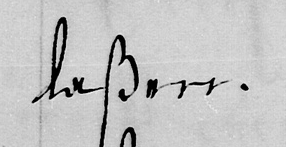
laßen.
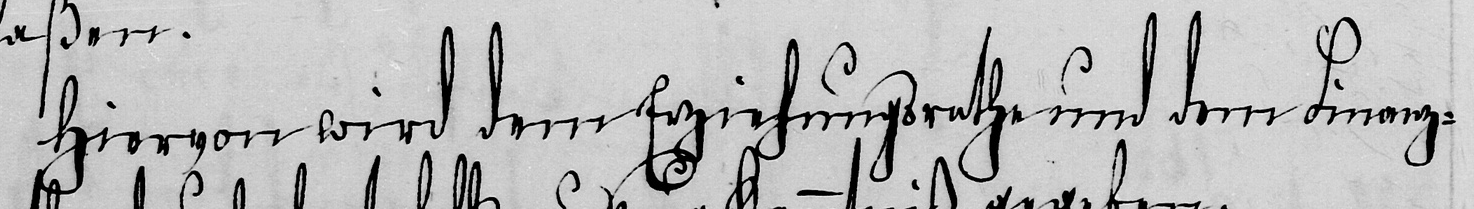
Hiervon wird dem Erziehungsrathe und dem Finanz¬
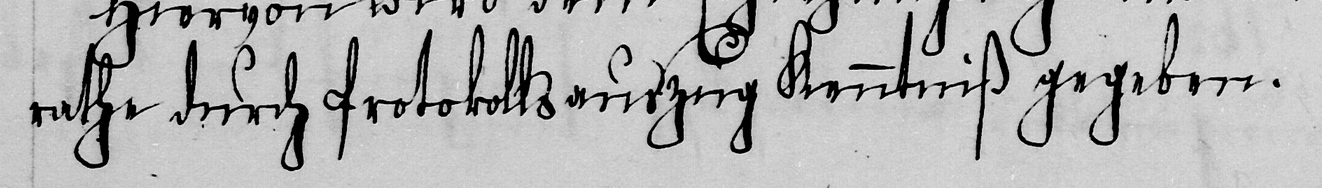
rathe durch Protokollsauszug Kenntniß gegeben.
